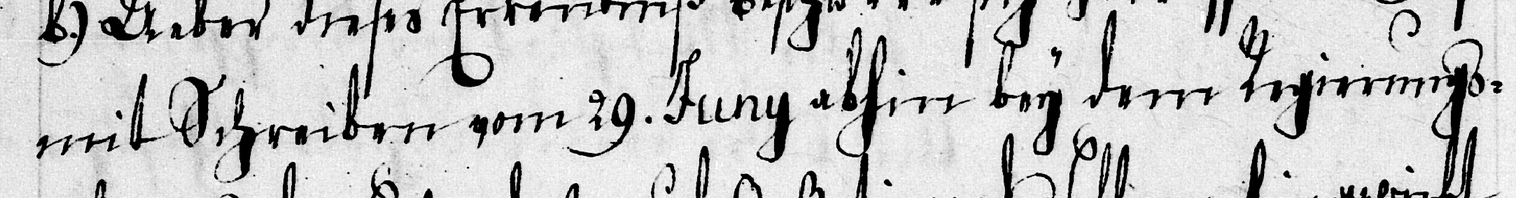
mit Schreiben vom 29. Juny abhin bey dem Regierungs¬
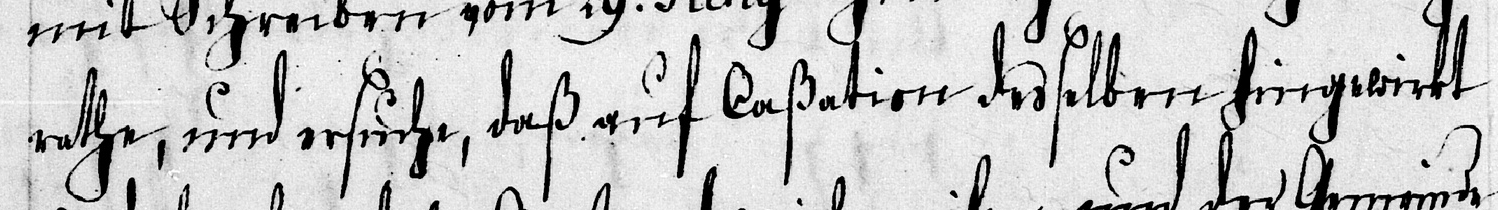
rathe, und ersuche, daß auf Caßation desselben hingewirkt
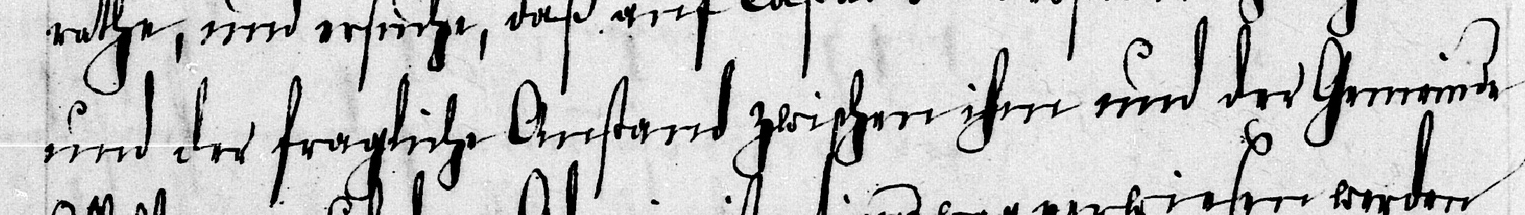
und der fragliche Anstand zwischen ihm und der Gemeinde
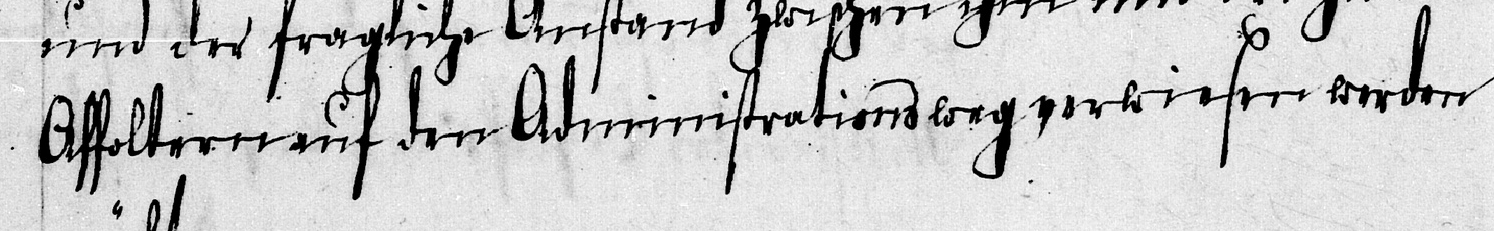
Affoltern auf den Administrationsweg verwiesen werden
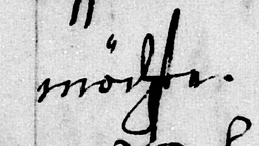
möchte.
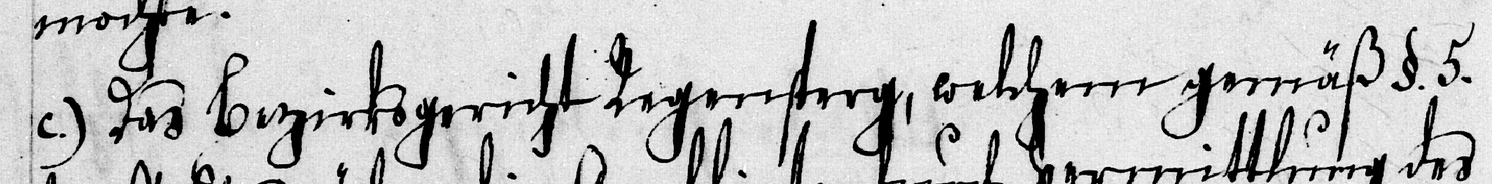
c.) Das Bezirksgericht Regensperg, welchem gemäß §. 5.
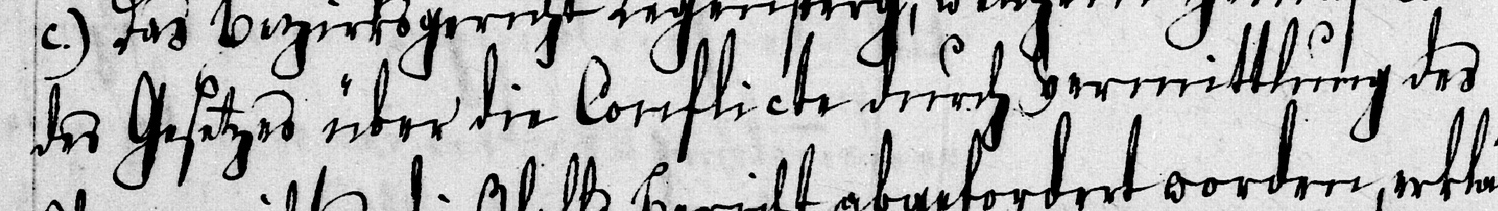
des Gesetzes über die Conflicte durch Vermittlung des
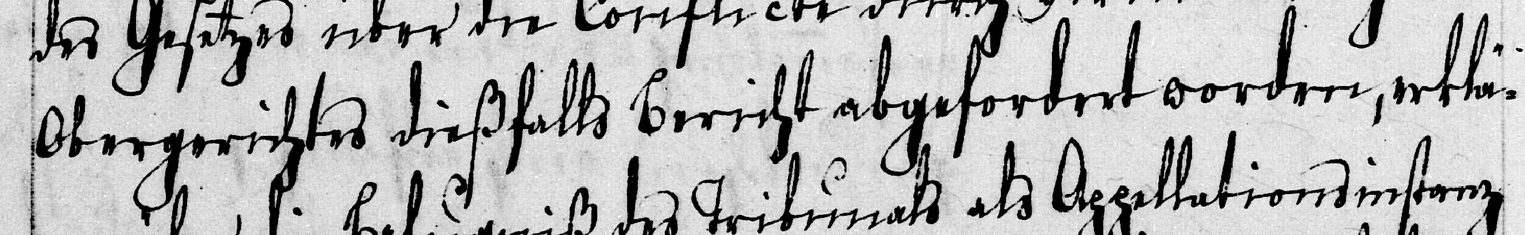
Obergerichtes dießfalls Bericht abgefordert worden, erklä¬
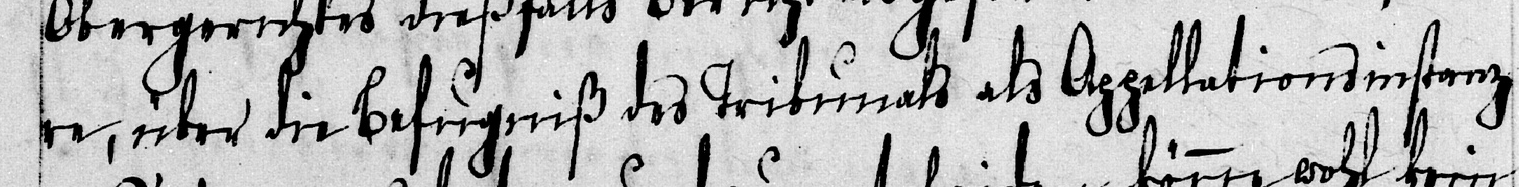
re, über die Befugniß des Tribunals als Appellationsinstanz
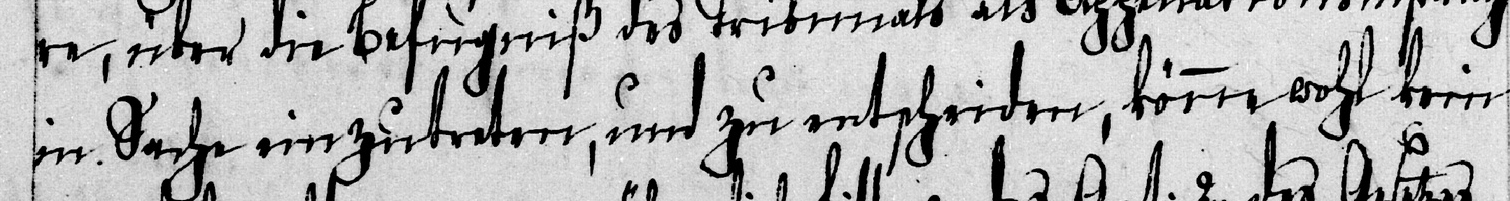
in Sache einzutreten, und zu entscheiden, könne wohl kein
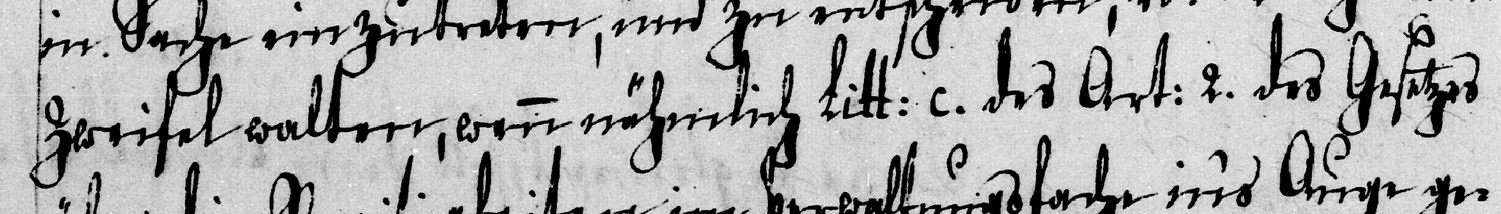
Zweifel walten, wenn nähmlich Litt: c. des Art: 2 des Gesetzes
